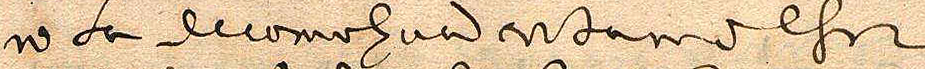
cōta de como huā certa molher
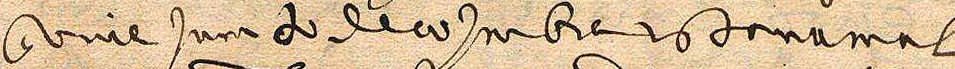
q̄ viue jumto de coJmbra estaua mal
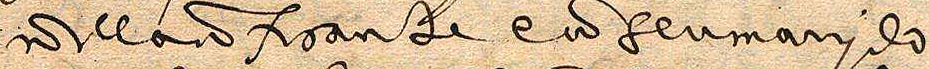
cō ella cōfesante e cō seu marydo
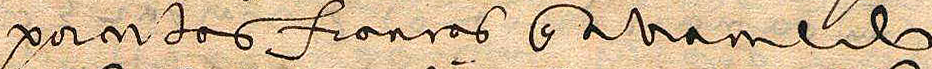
por certas fianças q̄ avia medo
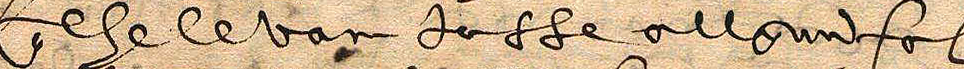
q̄ lhe levamtasse allguū faL
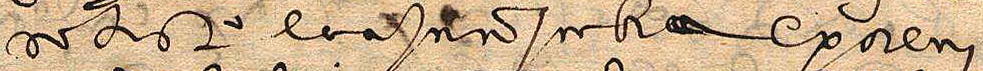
so testo laa Jn coJmbra e porem
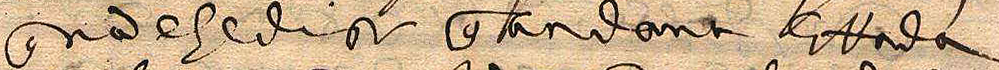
q̄ nā lhe dise q̄ andaua ERada
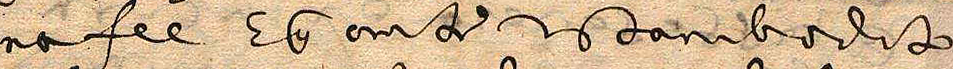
na fee E q̄ omtē estando o dito
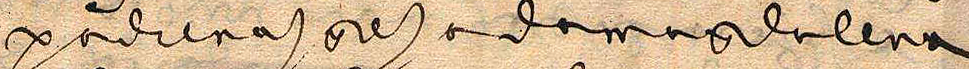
padre na JgreJa da magdalena
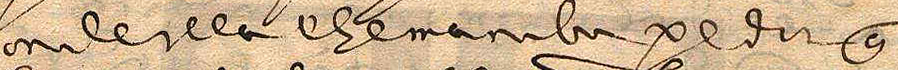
onde ella lhe mandou pedir q̄
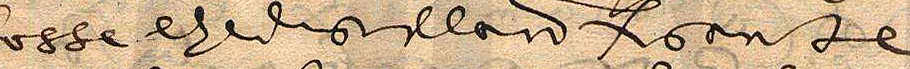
fosse lhe dise ella cōfesante
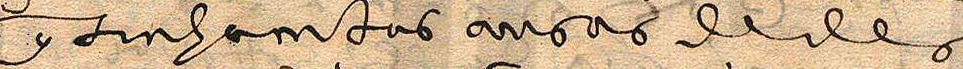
q̄ tinha certas cousas de des
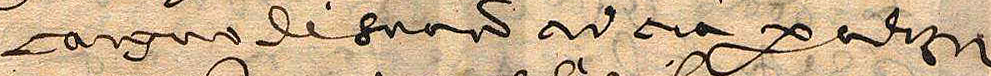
carguo de sua cōciēcia ꝑa dizer
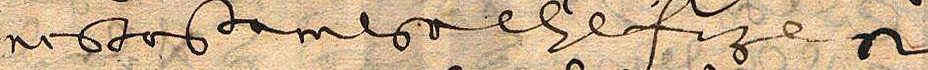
nesta sta mesa lhe fizese
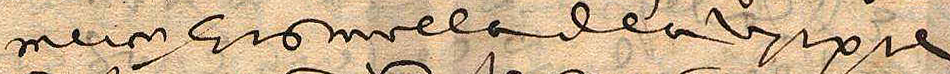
merçe E esmolla de a vjr pre
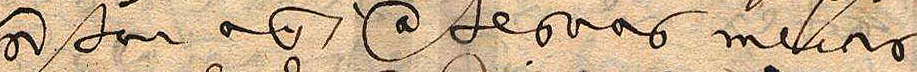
sētar aq̄j āte suas merces
